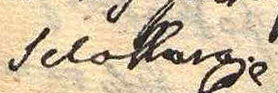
se callara.
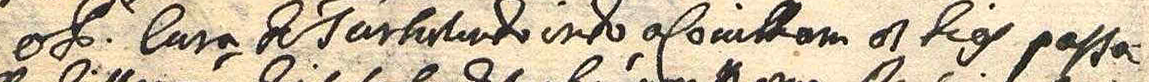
o P.e Cura de Turtuzendo indo a Couilham os dias passa
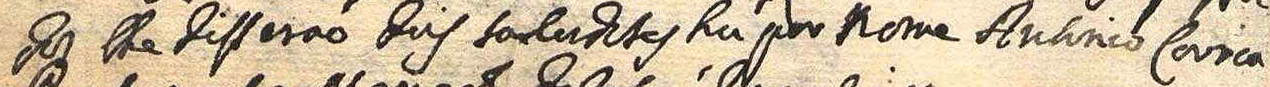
dos lhe disseraõ dois sacerdotes hū por nome Antonio Correa
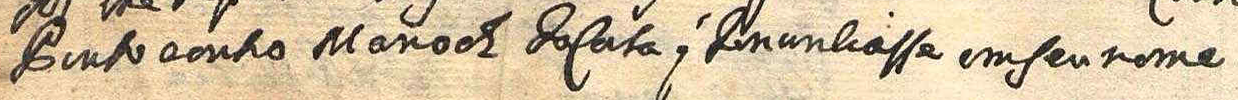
Pinto e outro Manoel da Cata q̄ denunciasse em seu nome
